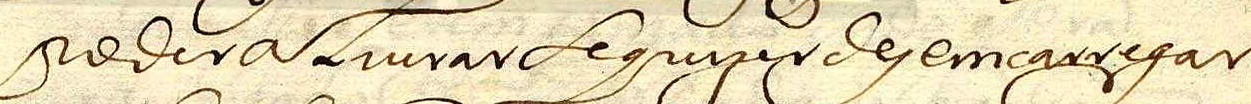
podera Liurar se quizer desemcarregar
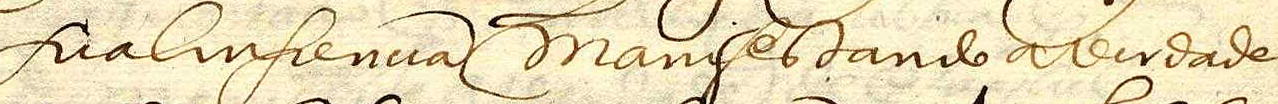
sua Consiencia manifestando a verdade
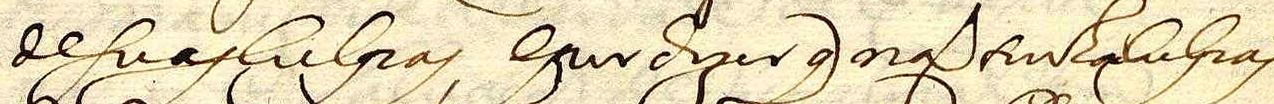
de suas Culpas, e por dizer q̄ naõ tinha Culpas
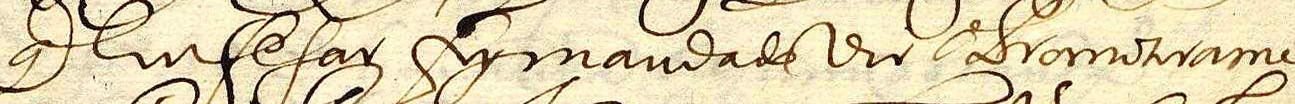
q̄ Confesar foy mandado vir o Promotor a me
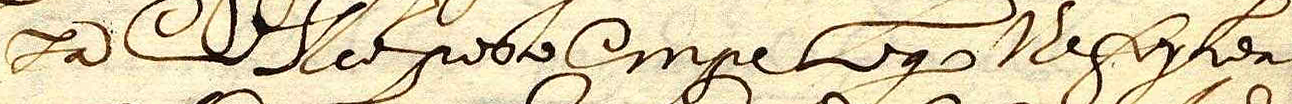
za e o Reo posto em pe Logo lhe foy Lida
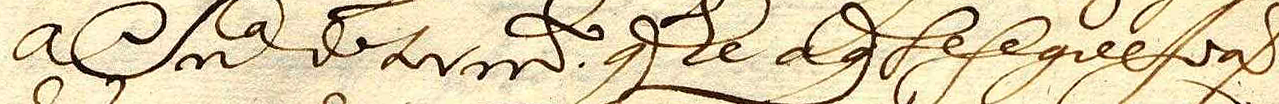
a Snça do torm.to q̄ he a q̄ se segue Joaõ
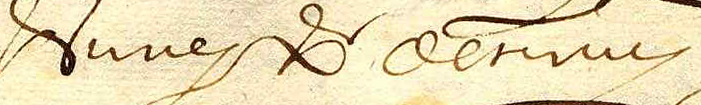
Nunes Xer o escreuj
